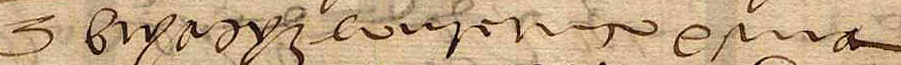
item bryatyz lourenco e sua
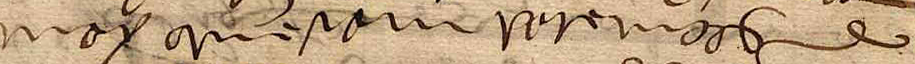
may que sam paremtas do
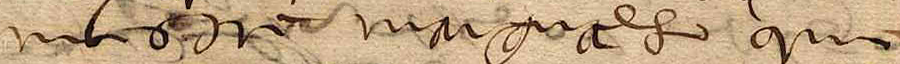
mestre margualho que
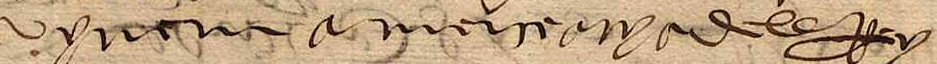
vyuem a mercearya dell Rey
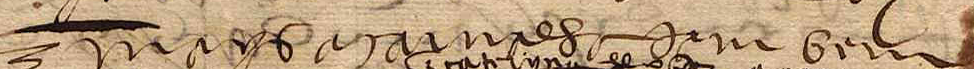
item mays a carualha tambem
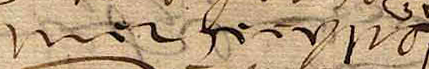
merceeyra
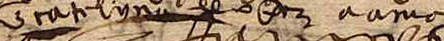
item cateryna llop̄ez a ama
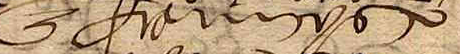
item framcysco
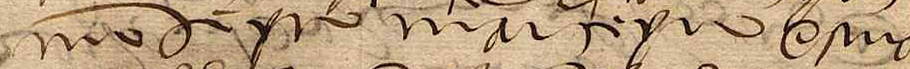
mōteyro marceyro e sua
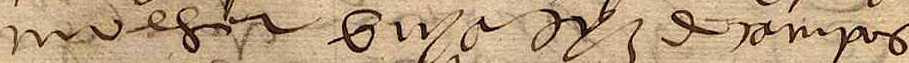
molher bryatyz de campos
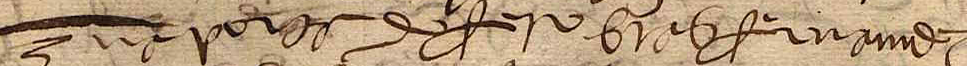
item na porta do fero bras fernamdez
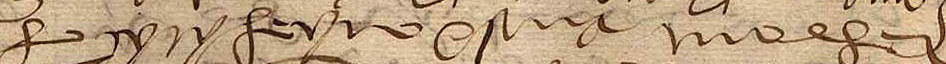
ho cyryheyro e sua molher
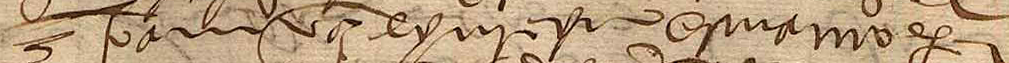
item Joam v̄az lyureyro e sua molher
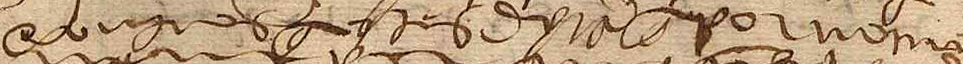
e outros q̄ estes dyrā q̄ por nome
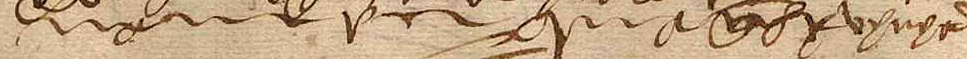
nam perqua q̄ hy vyuyā
